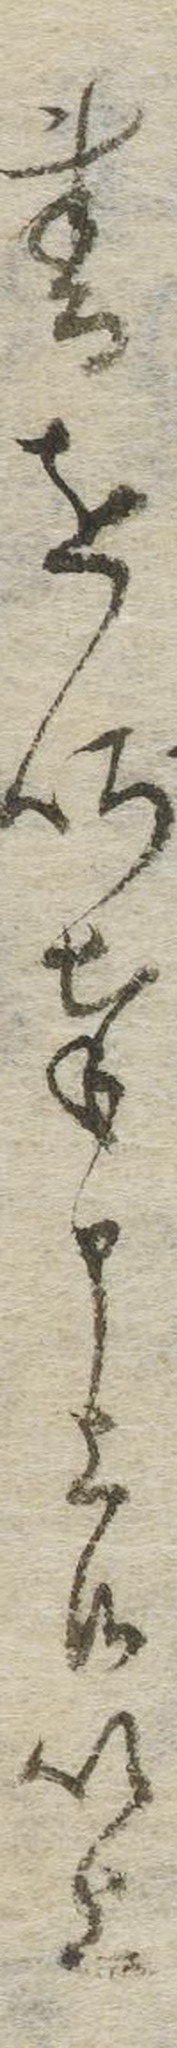書を以奉申上候以上
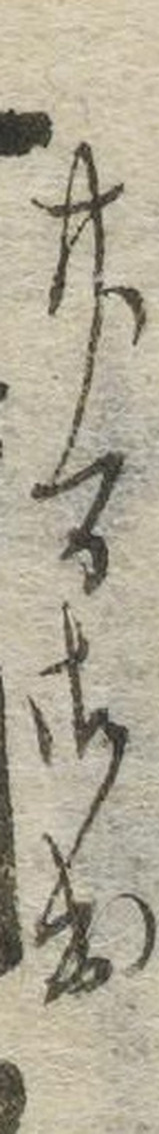廿一日御出
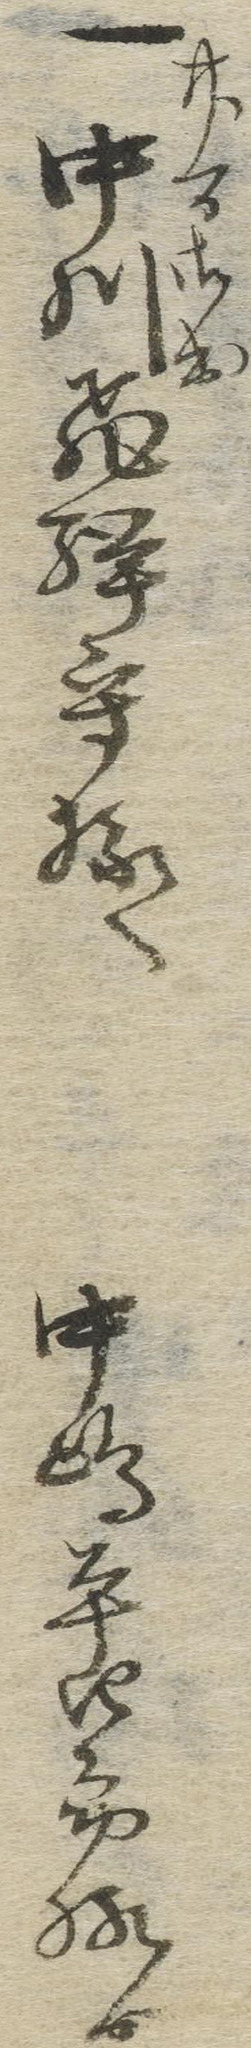一中川飛騨守様へ中嶋平次郎様ゟ

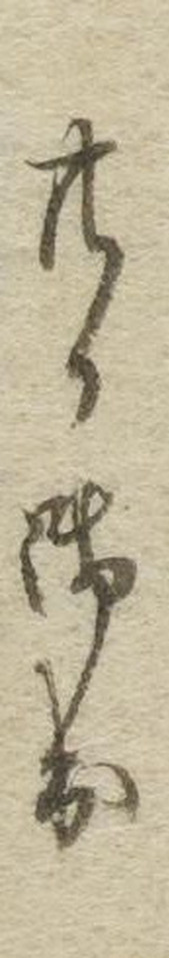廿日御出
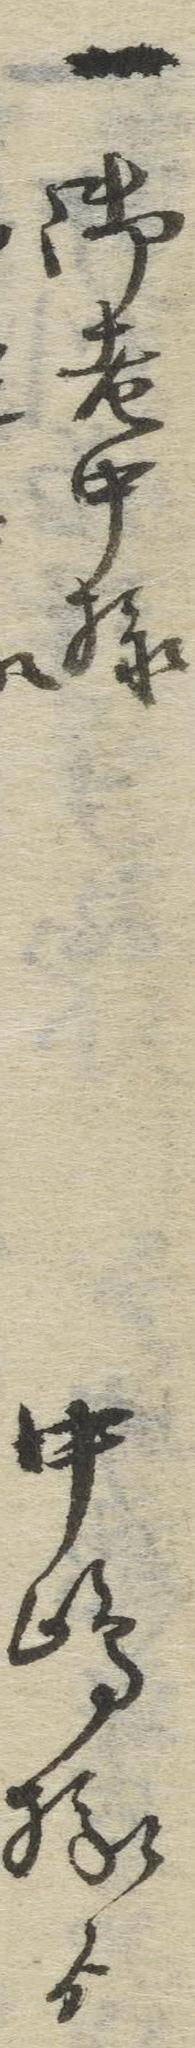一御老中様中嶋様ゟ
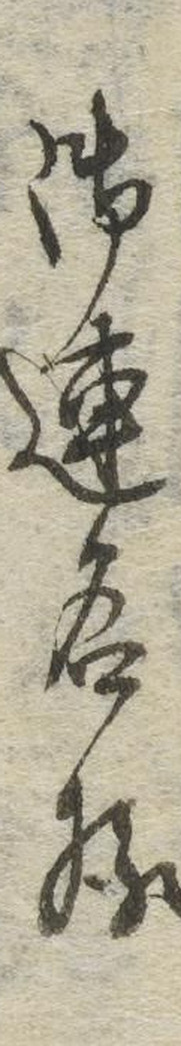御連各様
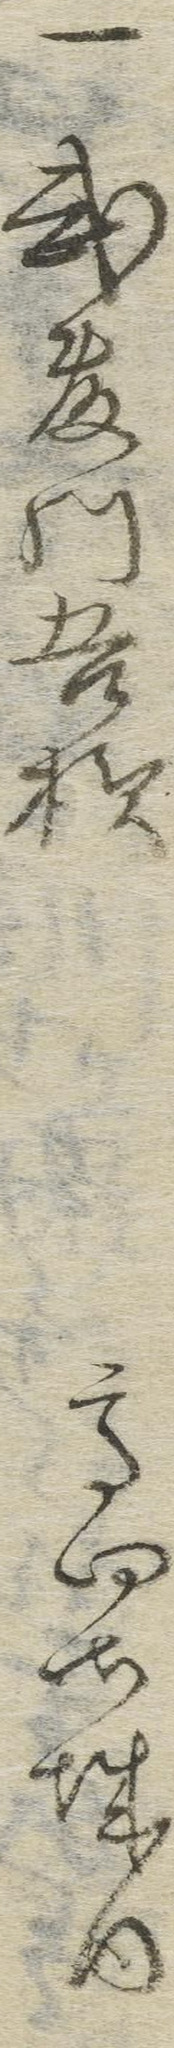一武藤門吾様高田御城内
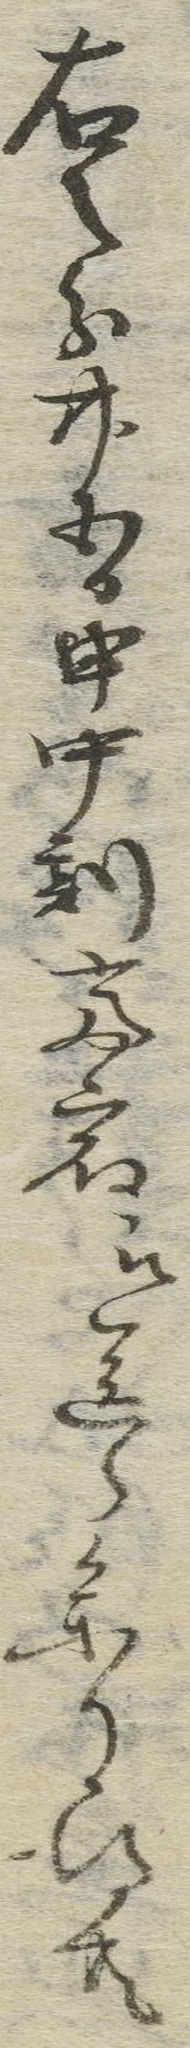右之分廿五日申中刻当宿江送り参り候得共
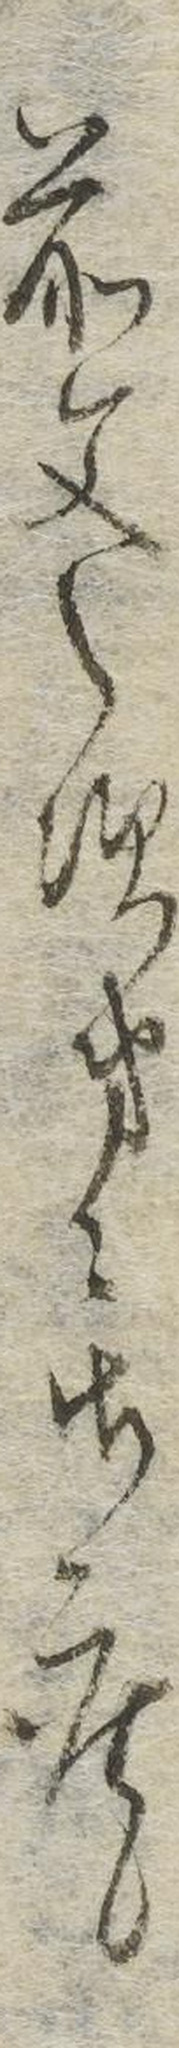前文之次第二御座候
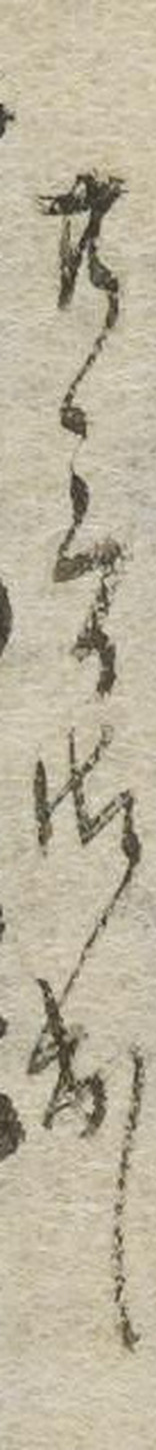廿三日御出し
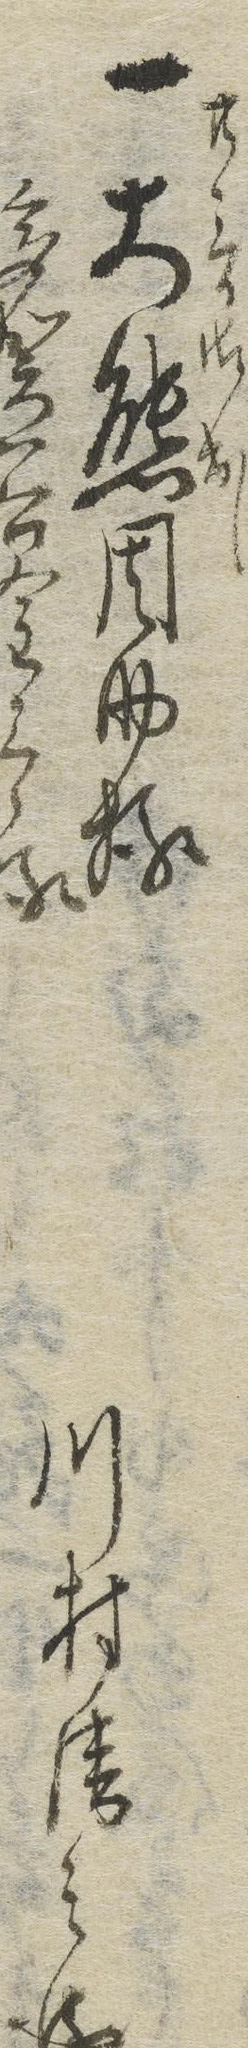一大熊周助様川村清兵衛
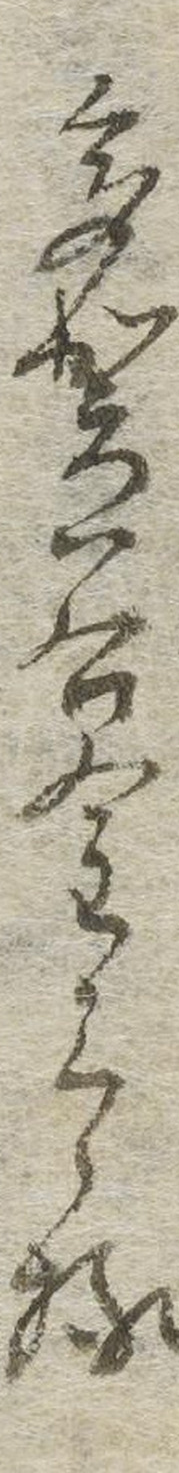多賀谷金三郎様
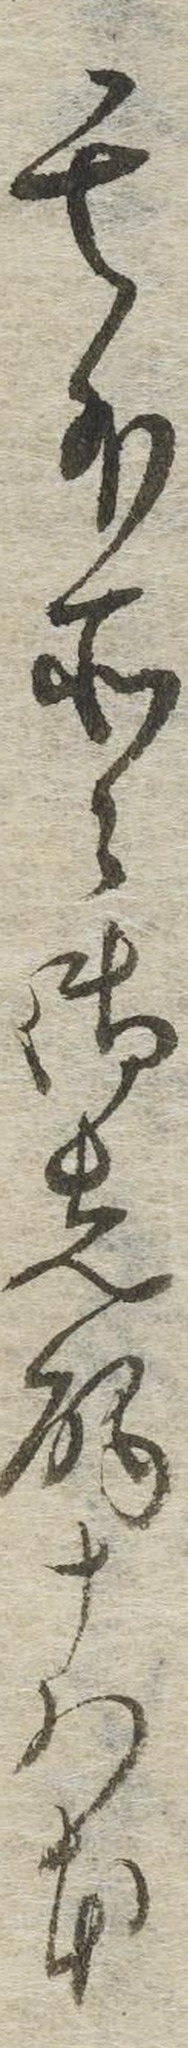其外所々御先触十八本
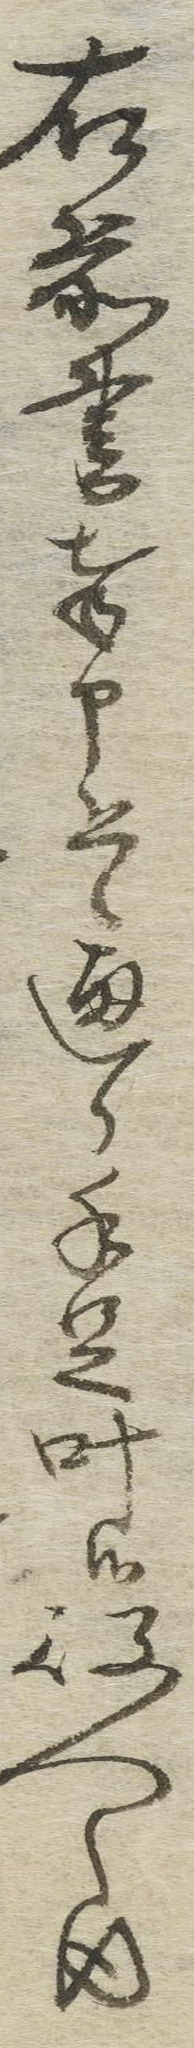右前書奉申上候通り手足叶候役人之内
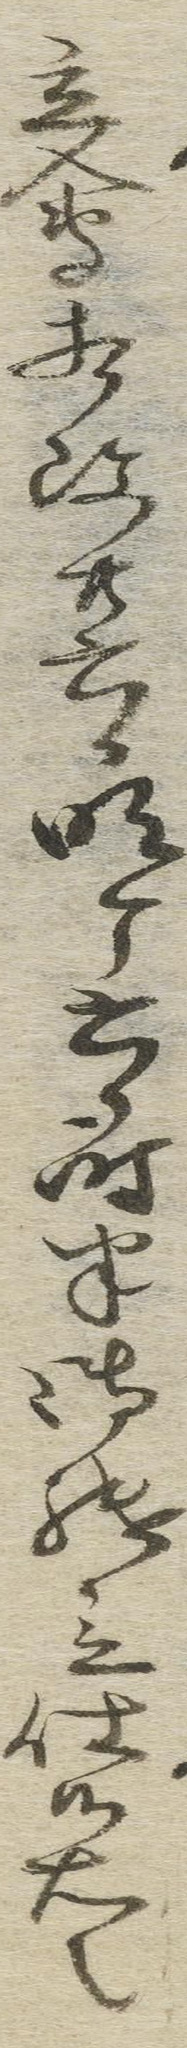立会相改廿六日明ヶ六ッ持半御継立仕候右之
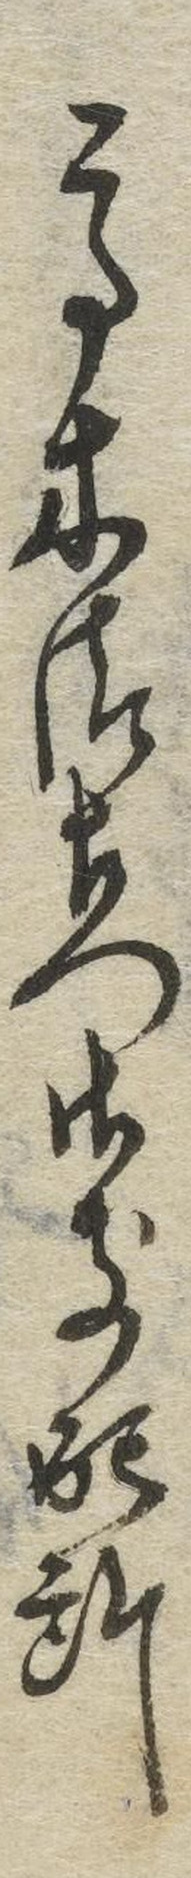高木清左衛門御支配所
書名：信濃越後　地震書留
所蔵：東京大学地震研究所図書室 Earthquake Research Institute Library, The University of Tokyo, JAPAN
